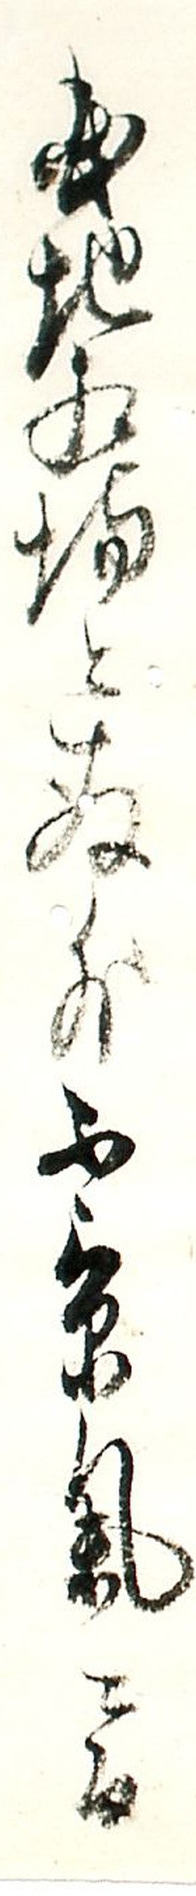当地相場は存外不景気に而
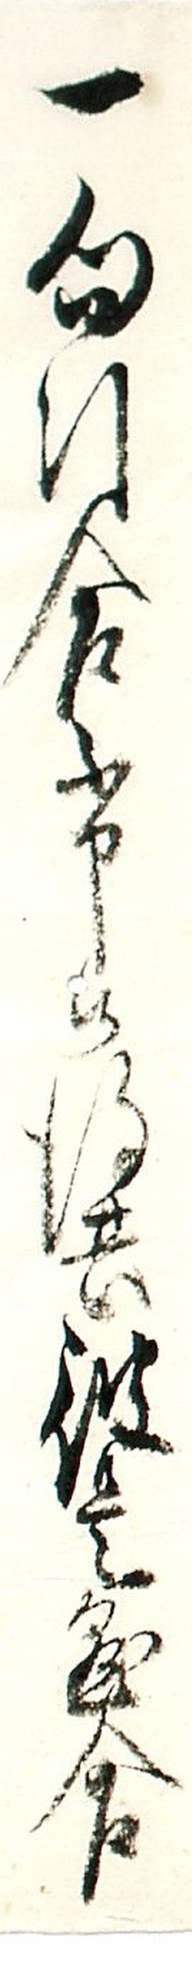一向引合不申候得共彼是懸合
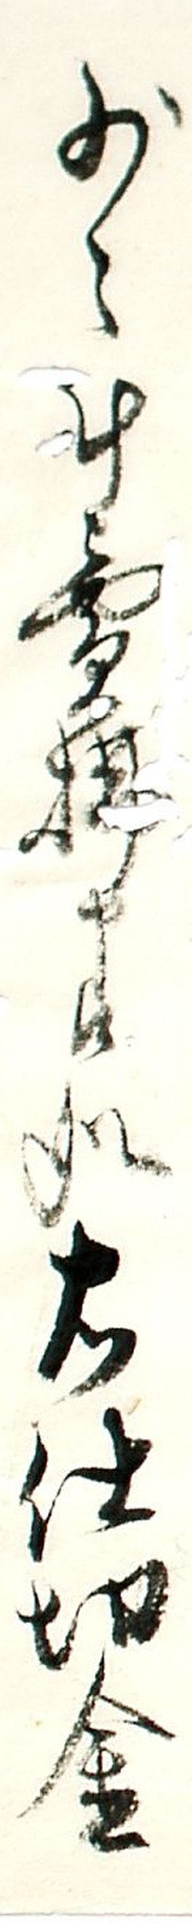少々計売払申候処右仕切金
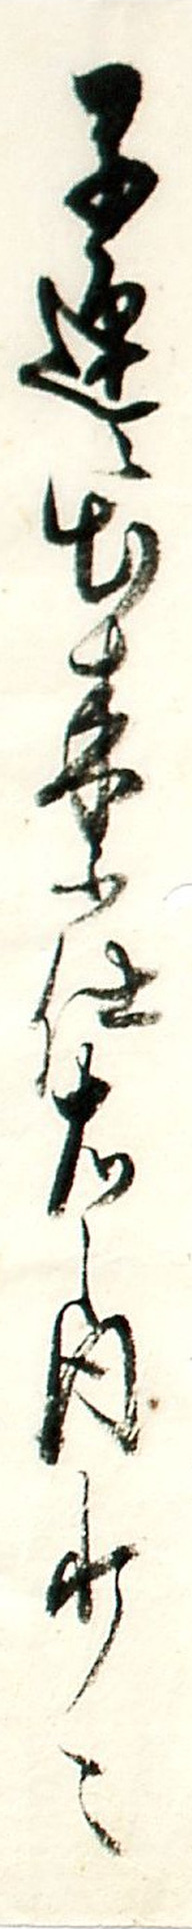早速に出来不仕右之内少々
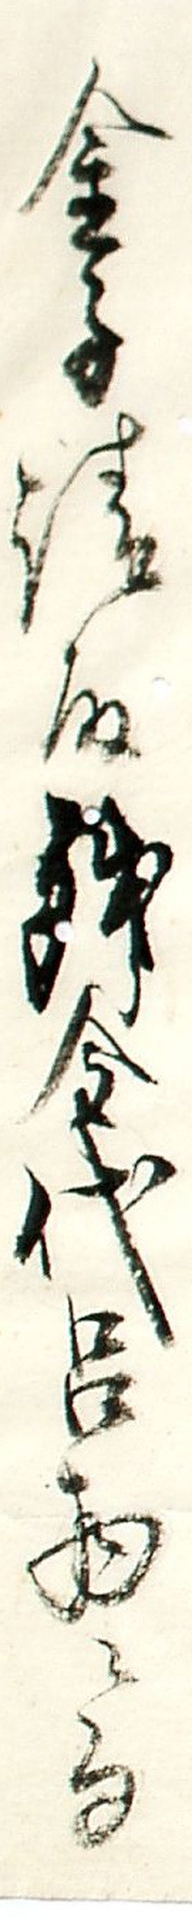金子請取残り金代呂物に而
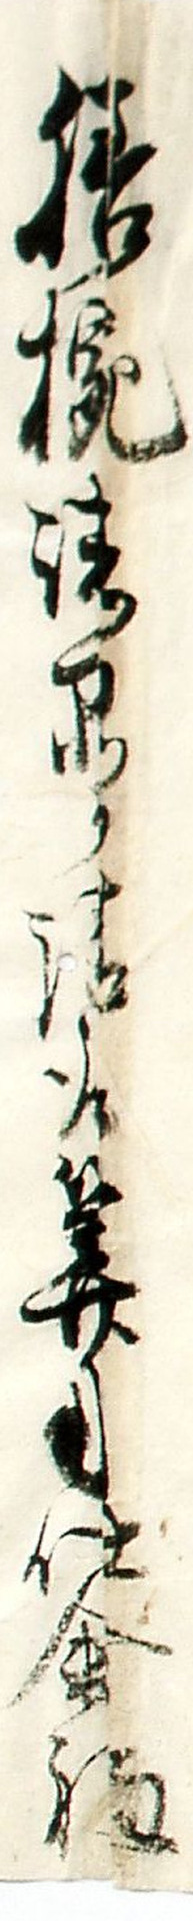膳椀諸品を請取算用仕余程
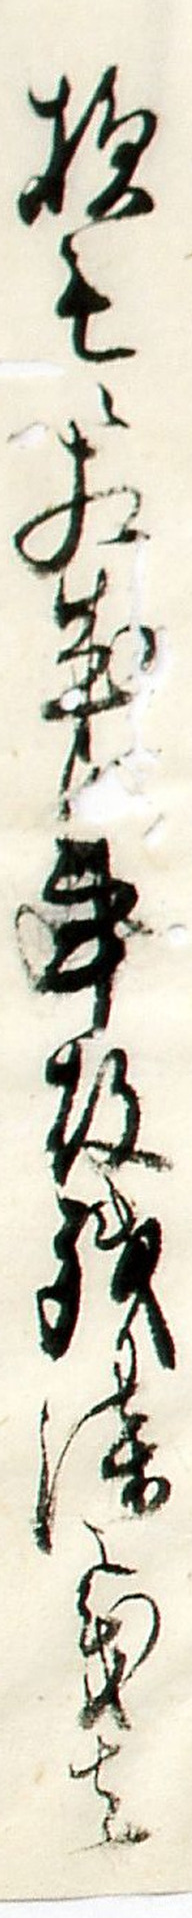損毛に相成候事故残り漆之義は
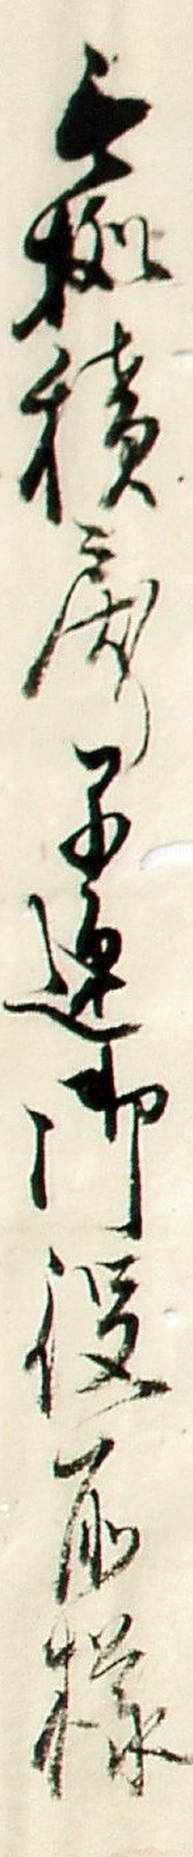無拠積戻り早速御役所様

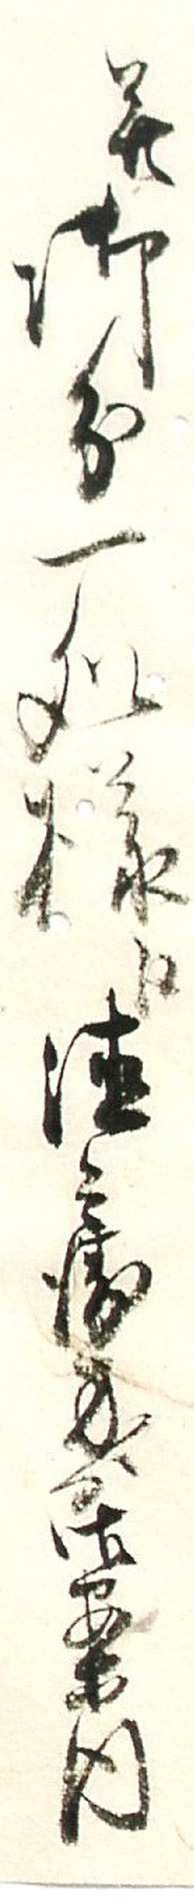幷御分一処様え徳兵衛方ゟ御案内
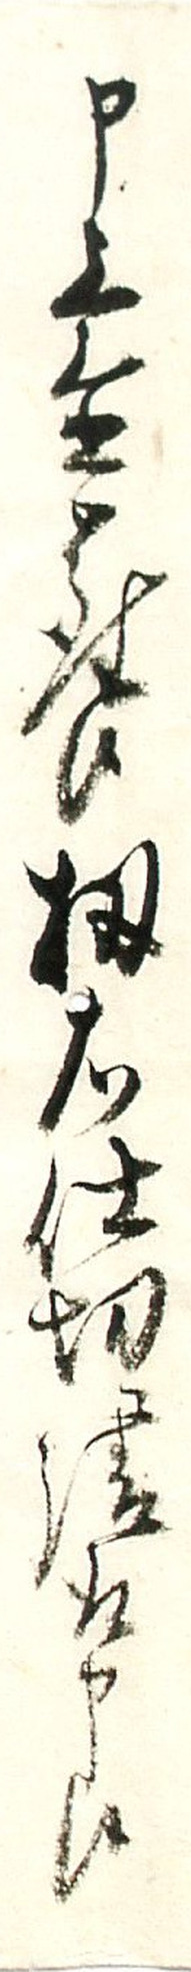申上置御座候扨右仕切に請取申候
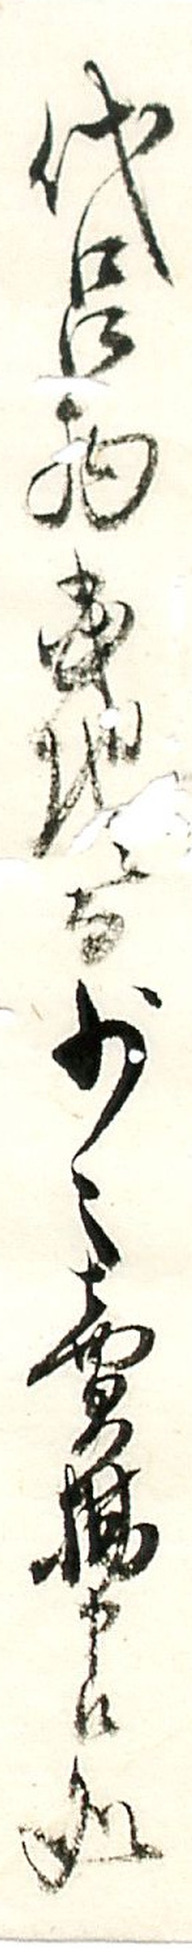代呂物当地に而少々売払申候処
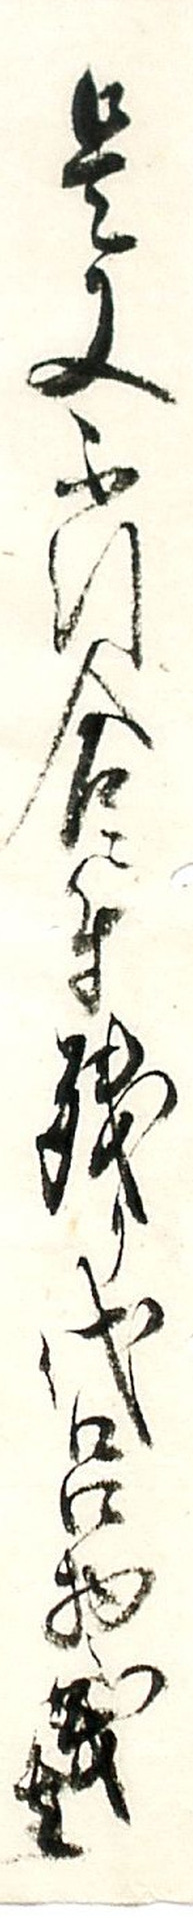是又不引合に付残り代呂物之義は
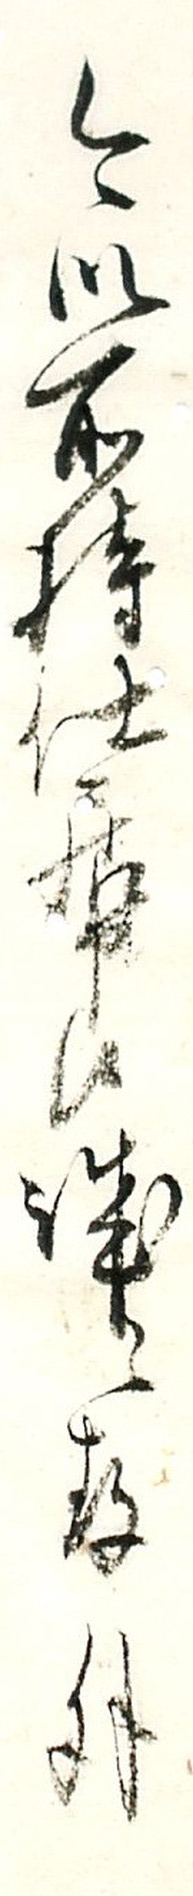今以所持仕居申候誠に存外
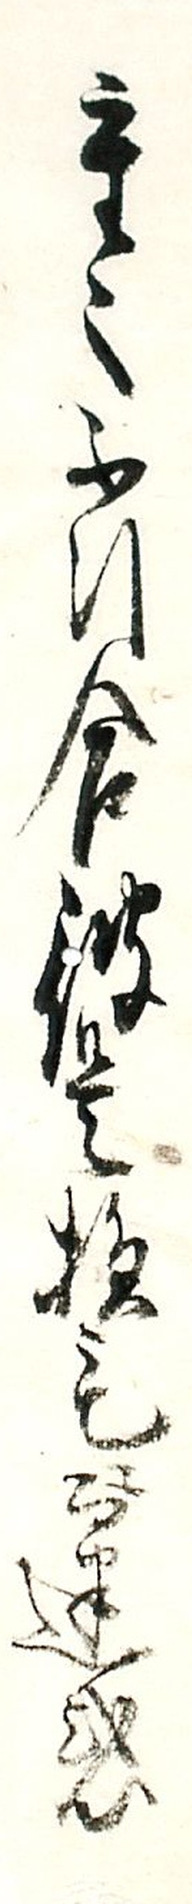重々不引合彼是損毛に而迷惑
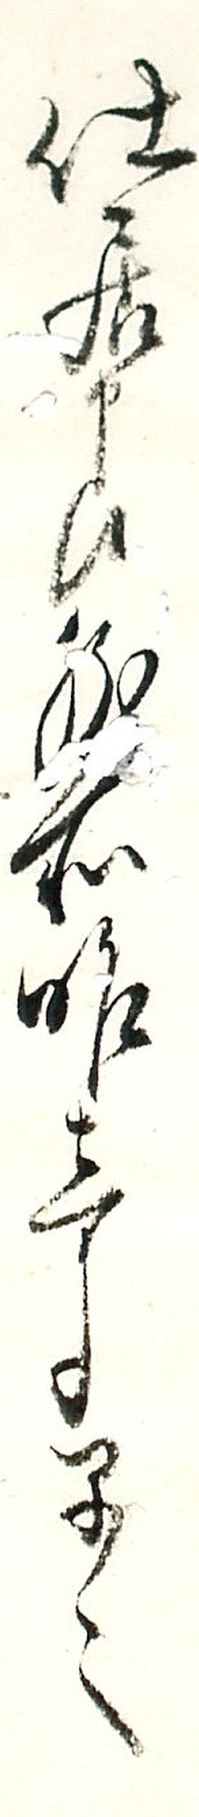仕居申候然所昨十二月早々
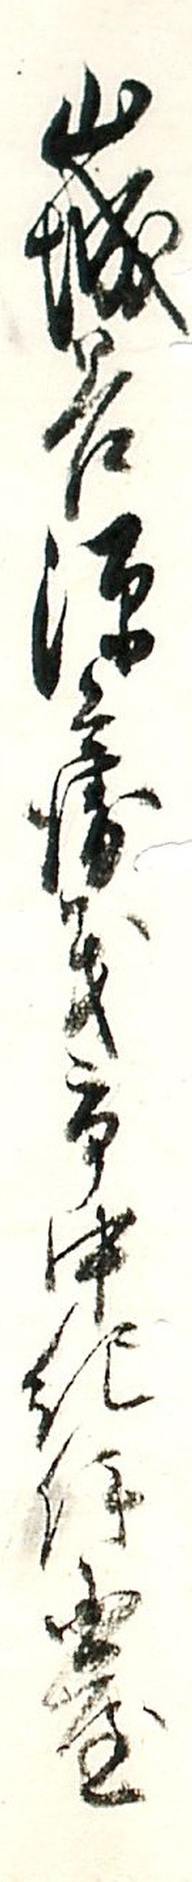山城谷源兵衛義市中紀伊国屋
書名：乍恐横切ヲ以奉申上覚（山城谷漆買入銀一件ニ付）
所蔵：鳴門教育大学 Naruto University of Education
